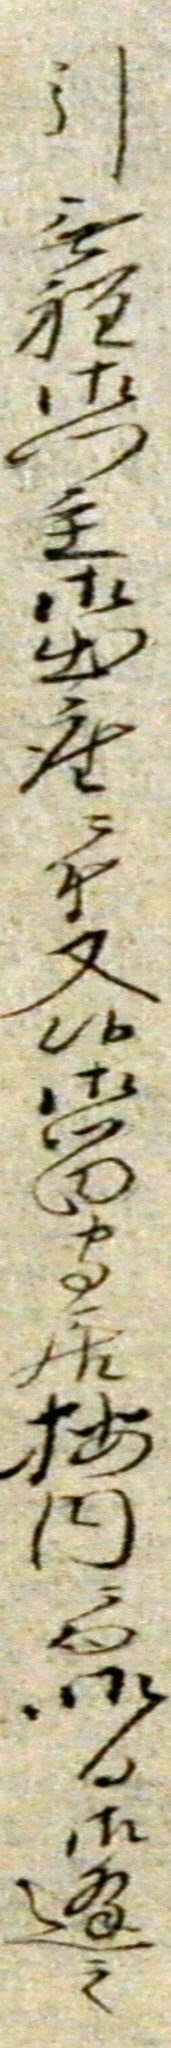引無程御門主御出座ニ付又候御留守居按内ニ而昨日御逢
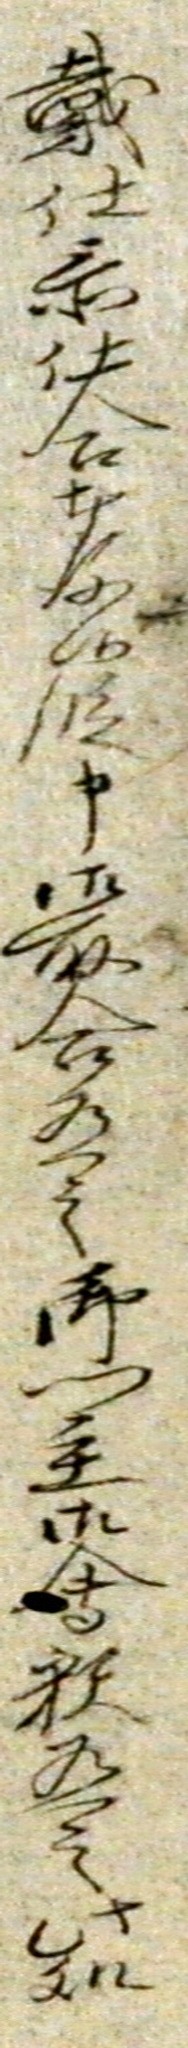理頂戴仕忝仕合奉存候段申御取合有御門主御会釈有之此
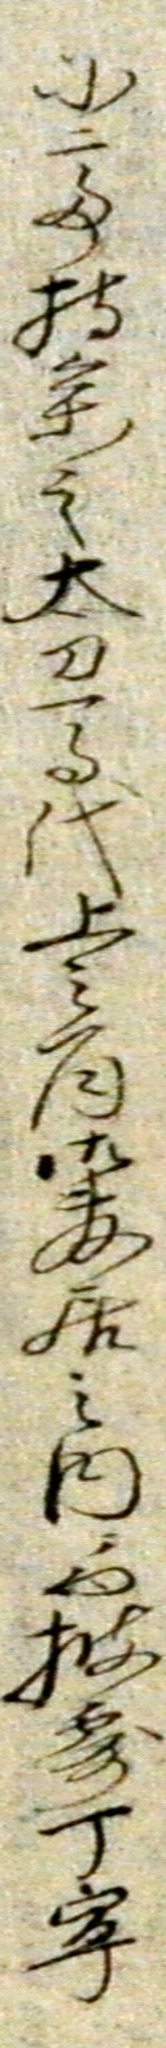処尓亭持参之太刀馬代上之間御敷居之内二而披寄丁寧
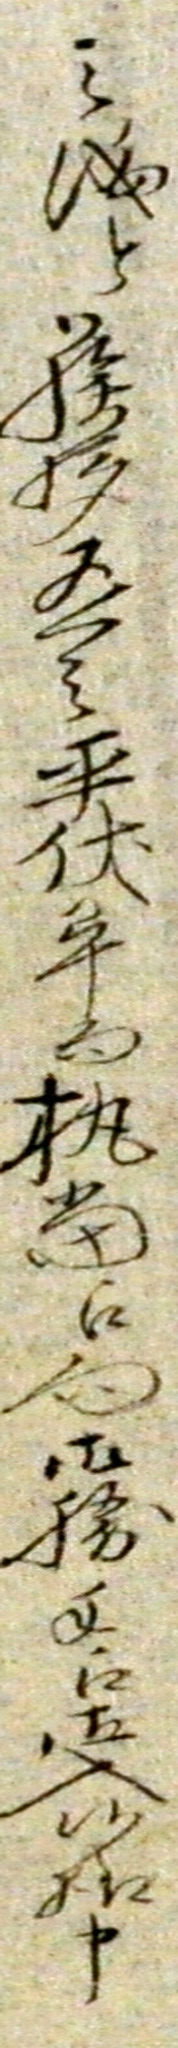之儀御挨拶有之平伏畢而執當江向御勝手江御入候様申
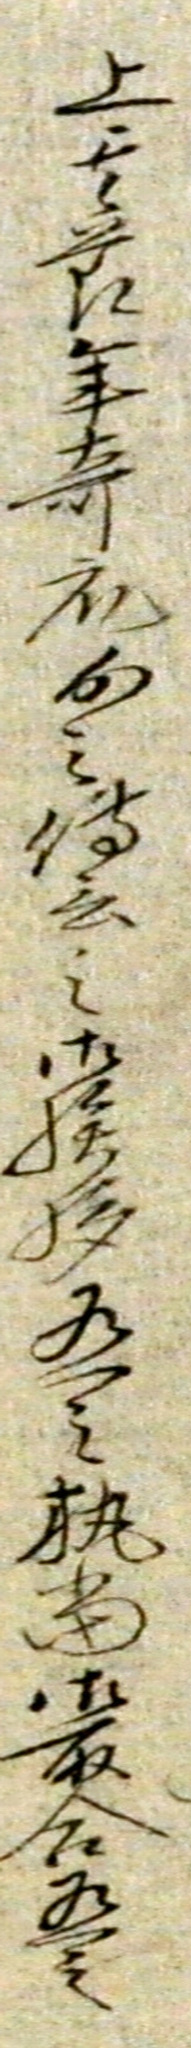上其節年寄衆ゟ之伝言之御挨拶有之執當御取合有之
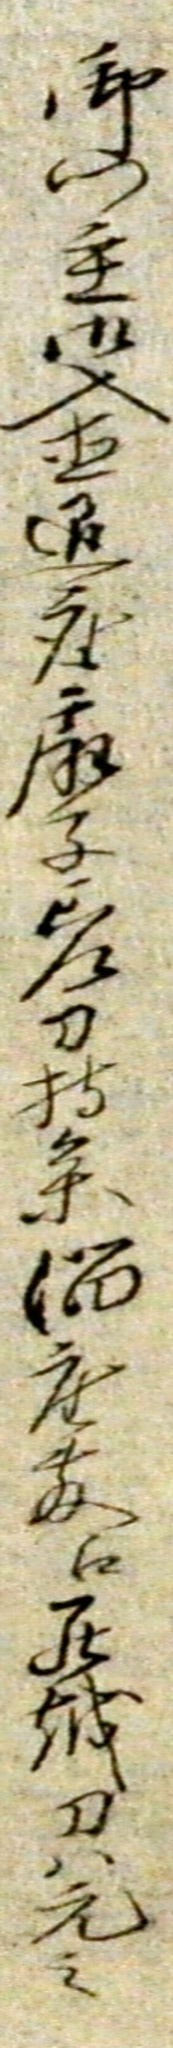御門主御入直退座扇子差刀持参溜座敷江罷刀ㇵ元之
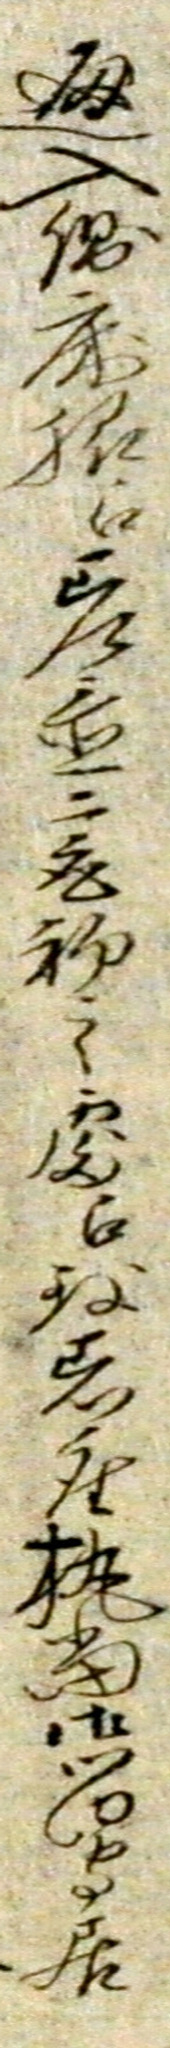通入側床脇江差置二取初之處江致着座執當御留守居
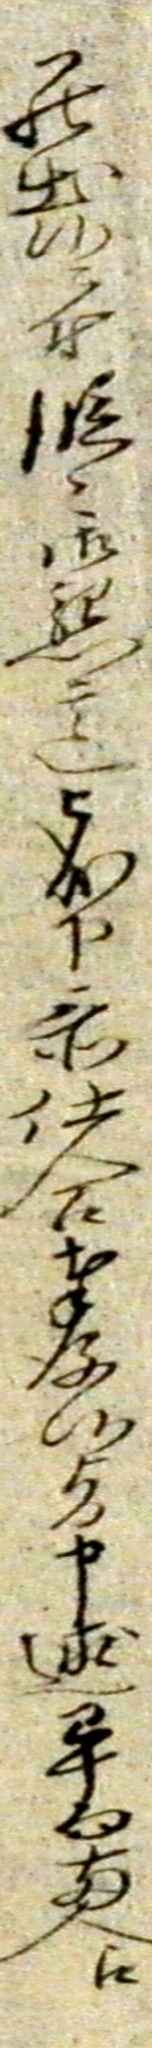罷出候二付段々御懇意ヒ成下忝仕合奉存候旨申述畢人江
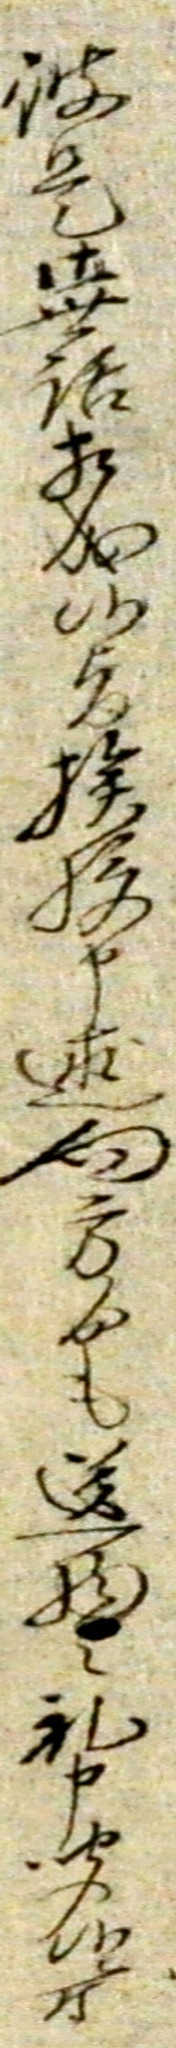彼是御世話相成候旨挨拶申述向方ゟも送物之礼申聞候付
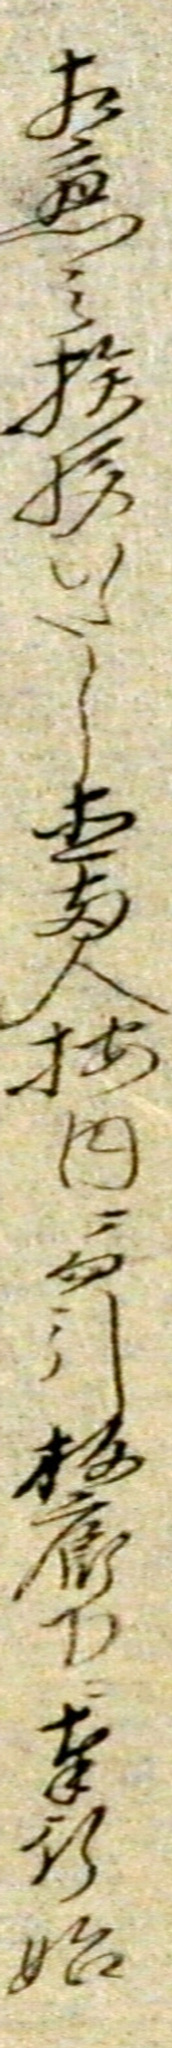相応之挨拶いたし直両人按内ニ而引移廊下奉行始
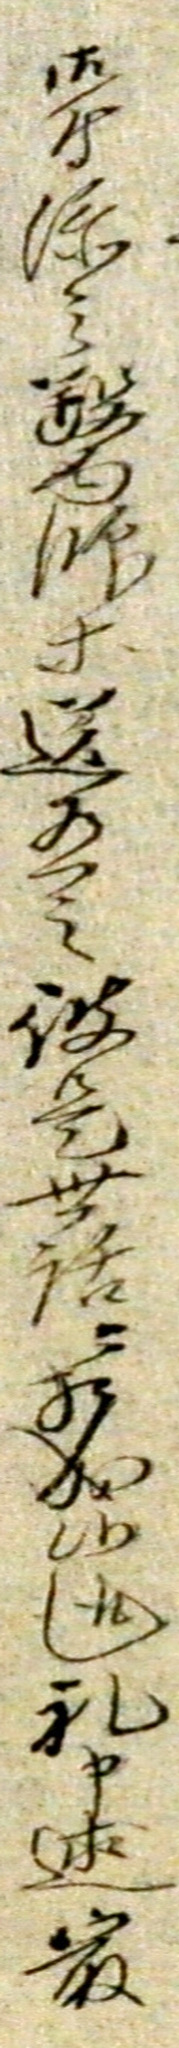御付添之医師抔送有之彼是世話二相成候趣礼申述最
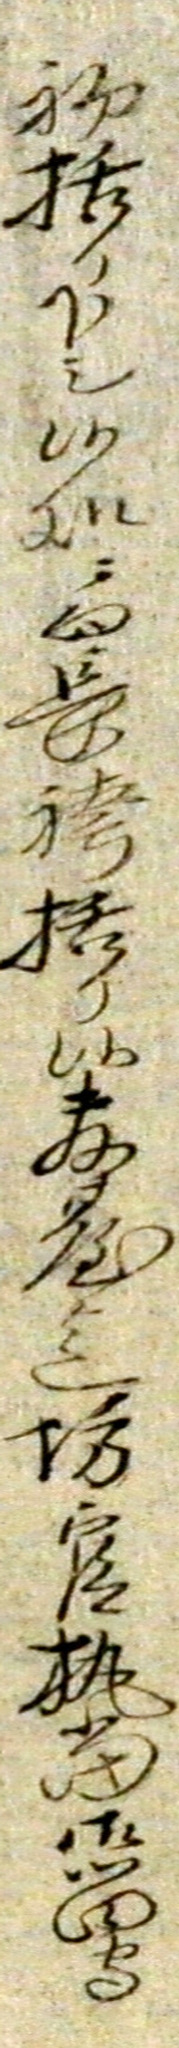初括り下シ候処二而長袴括り候敷臺迄坊官執當御留守
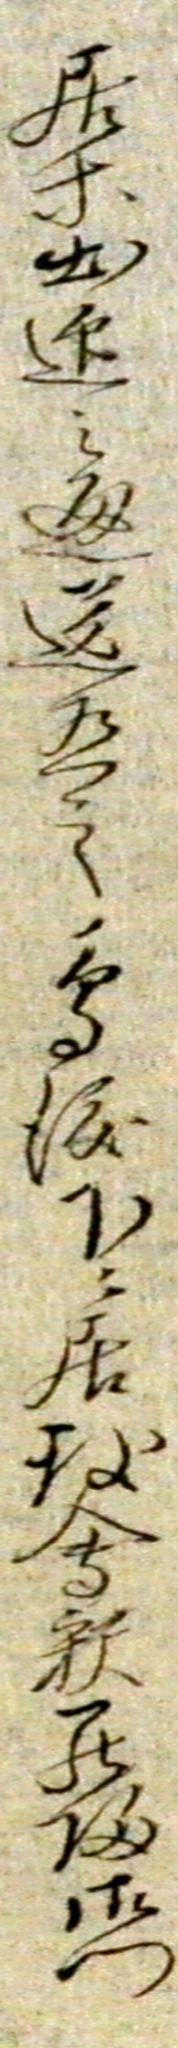居抔出迎之通送有之鳥渡下二居致会釈罷帰御門
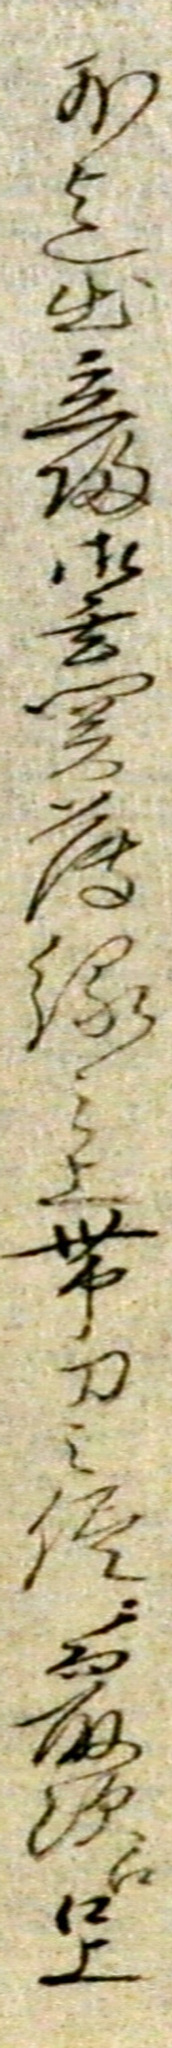外迄出立帰御玄関薄縁之上帯刀之儘二而取次江口上
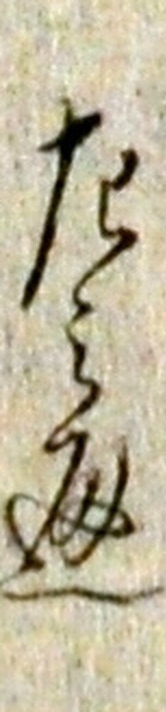左之通
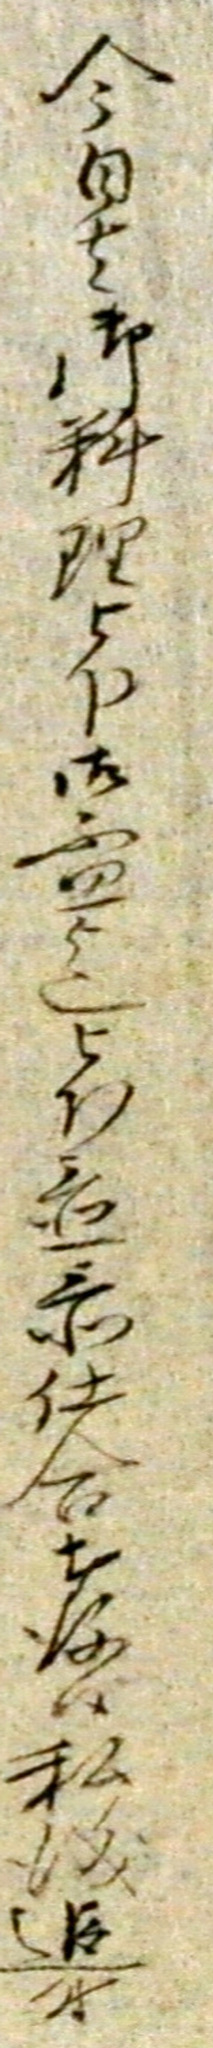今日者御料理ヒ下御盃迄ヒ下置忝仕合奉存候私儀追付
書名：日光御名代相勤候節ノ留
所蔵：伊那市立高遠町図書館・合同会社AMANE
